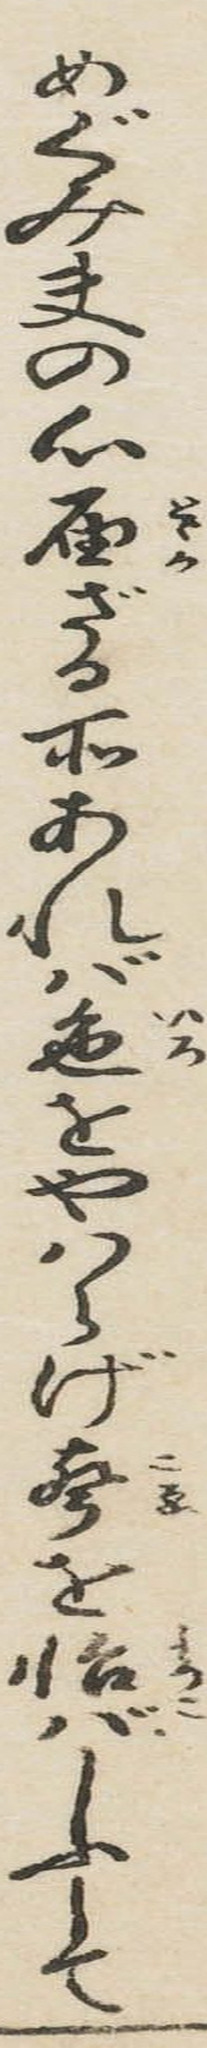めぐみ夫の心届ざる所あれば色をやはらげ声を怡ばしふして
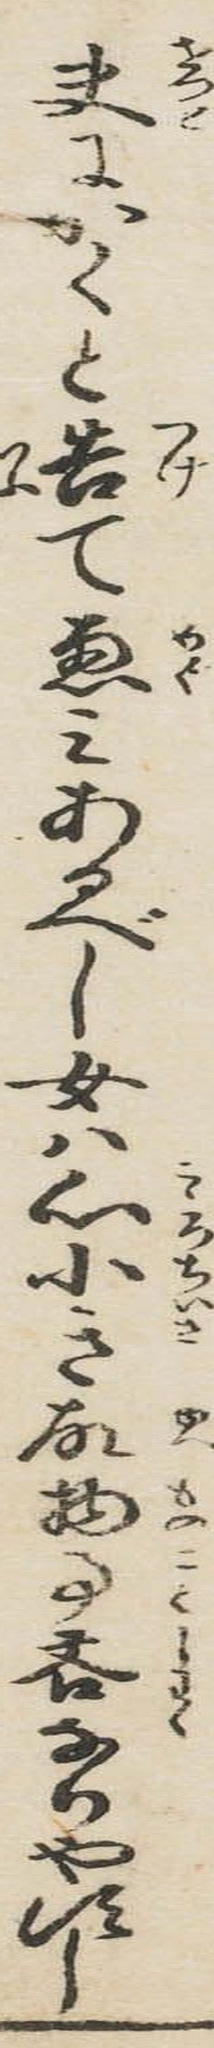夫にかくと告て恵みあるべし女は心小き故物事吝なりやすし
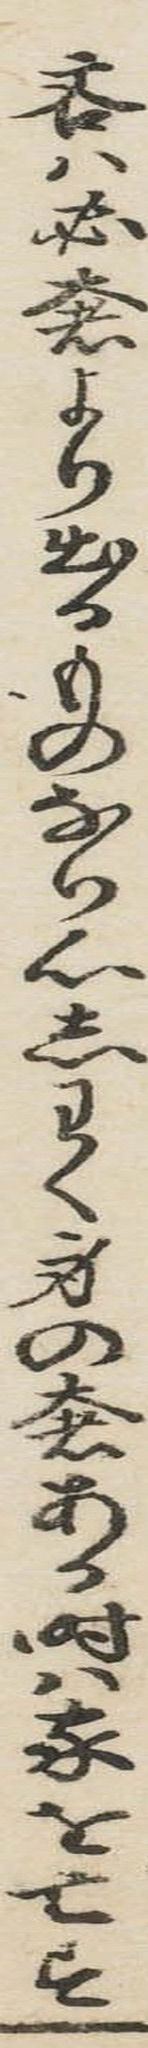吝は必奢より出るものなり心しわく身の奢ある時は家を亡す
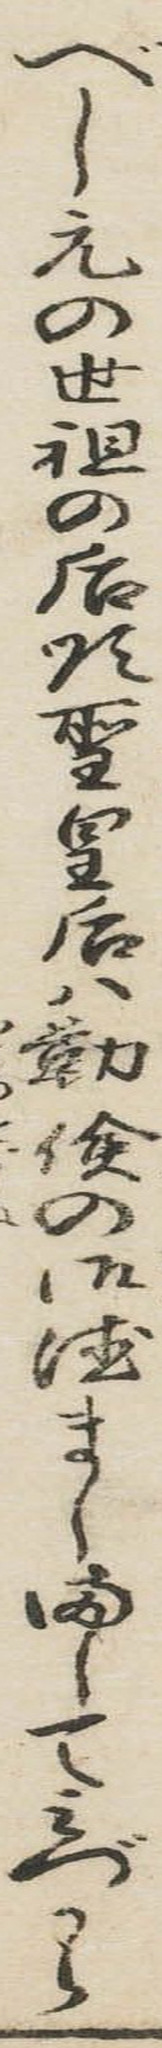べし元の世祖の后順聖皇后は勤倹の御徳ましましてみづから
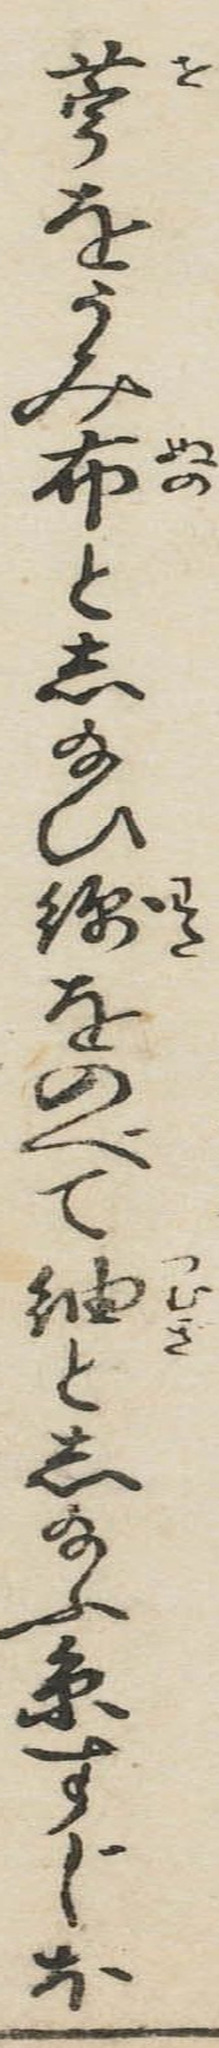苧をうみ布とし給ひ綿をのべて紬とし給ふ糸すじほ
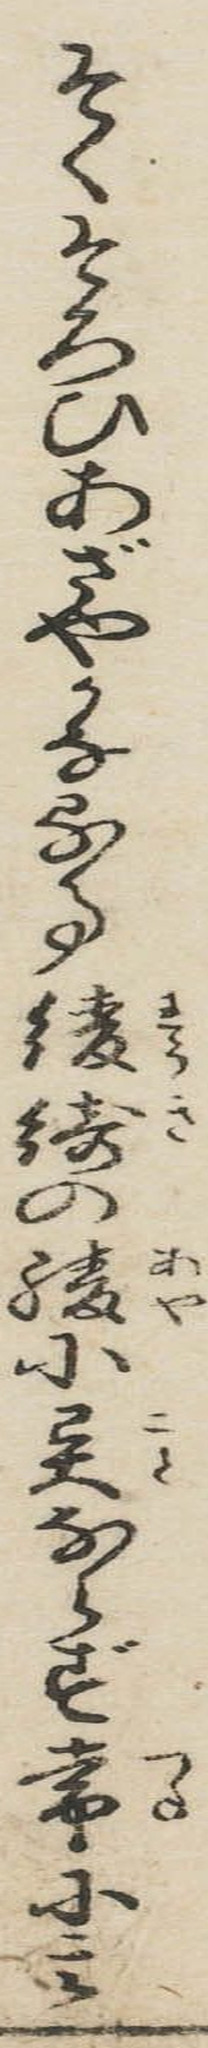そくそろひあざやかなる事綾綺の綾に異ならず常に
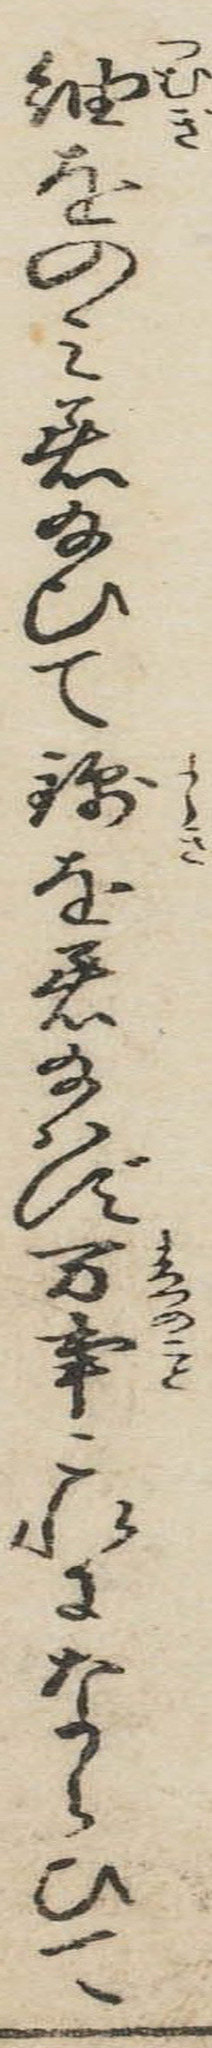紬をのみ着給ひて錦を着給はず万事これにならひて
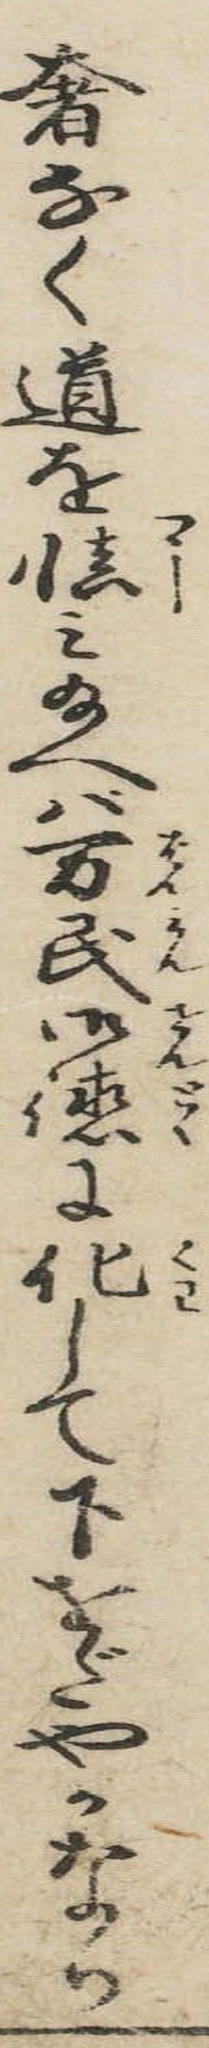奢なく道を慎み給へば万民御徳に化して下をだやかなり
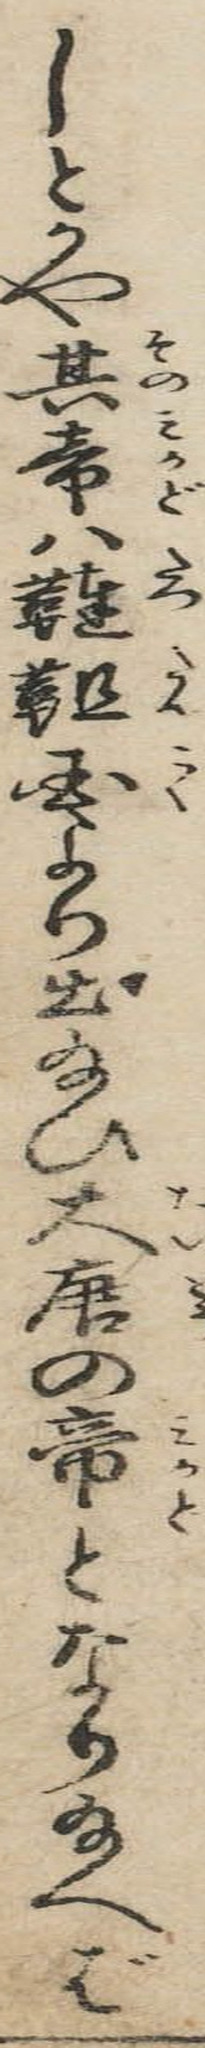しとや其帝は韃靼国より出給ひ大唐の帝となり給へば

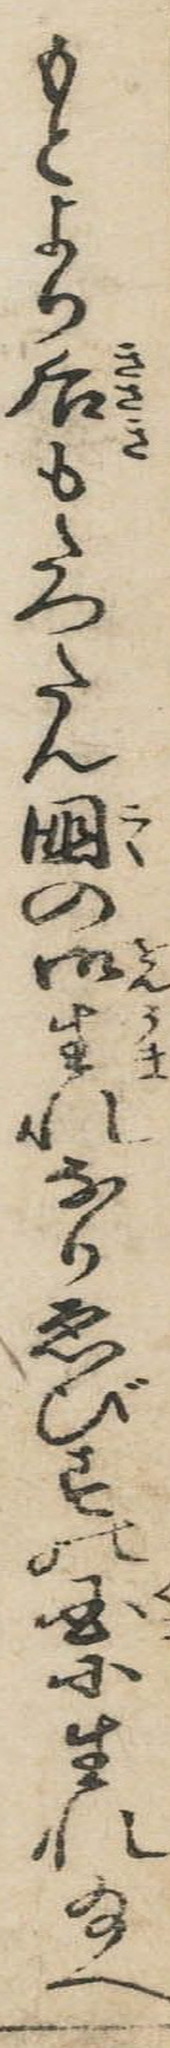もとより后もたつたん国の御生れなりゑびすの国に生れ給へ
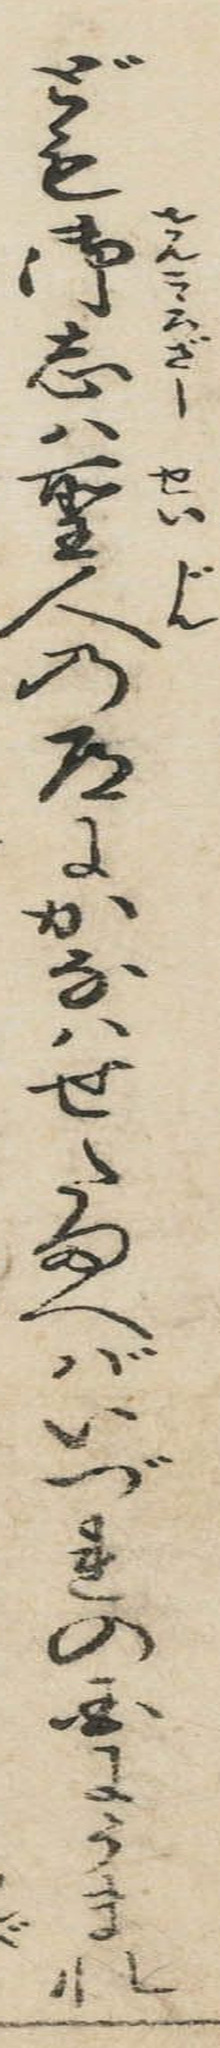ども御志は聖人の道にかなはせたまへばづれの国にうまれ
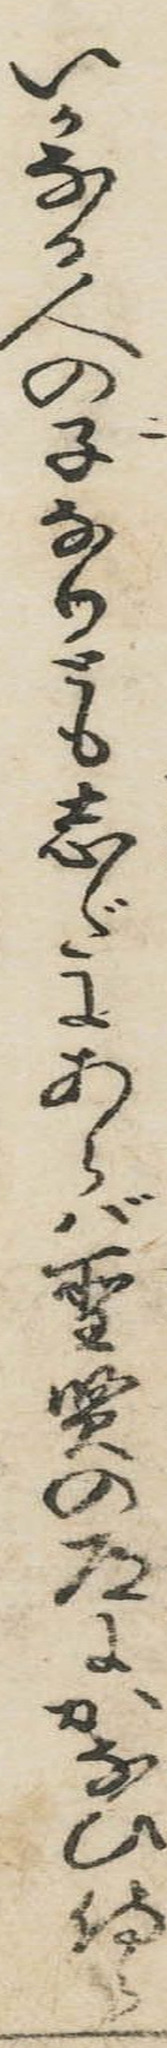いかなる人の子なりとも志だにあらば聖賢の道にかなひ侍ら
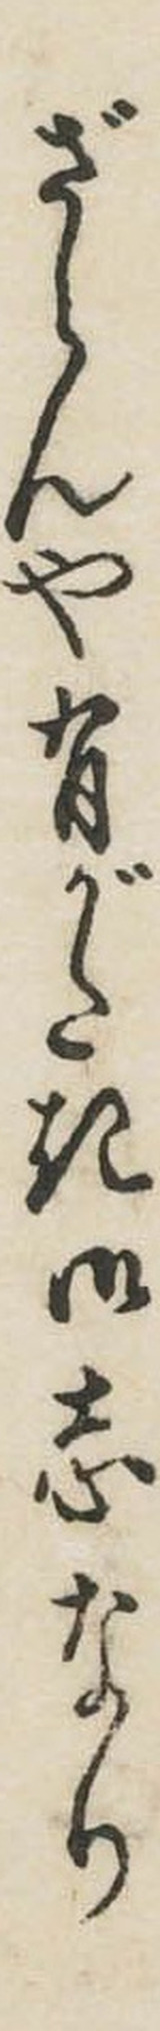ざらんや有がたき御志なり
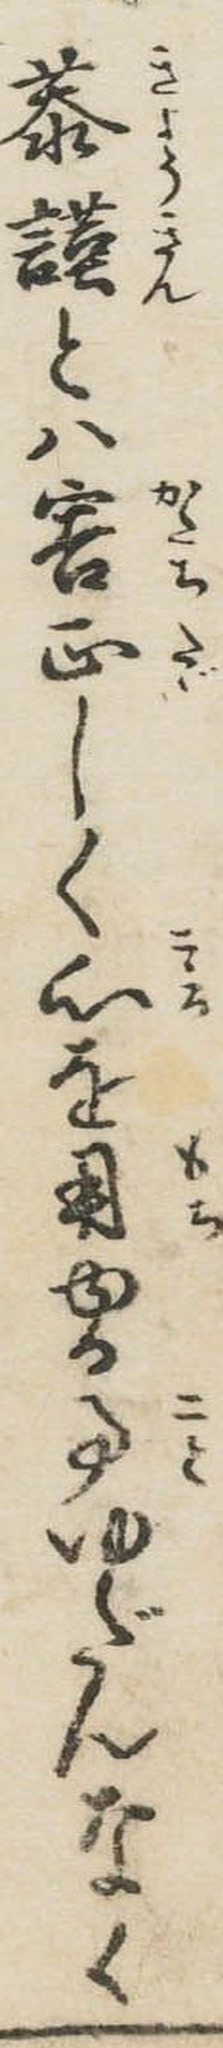恭謹恭謹とは容正しく心を用ゆる事ゆだんなく
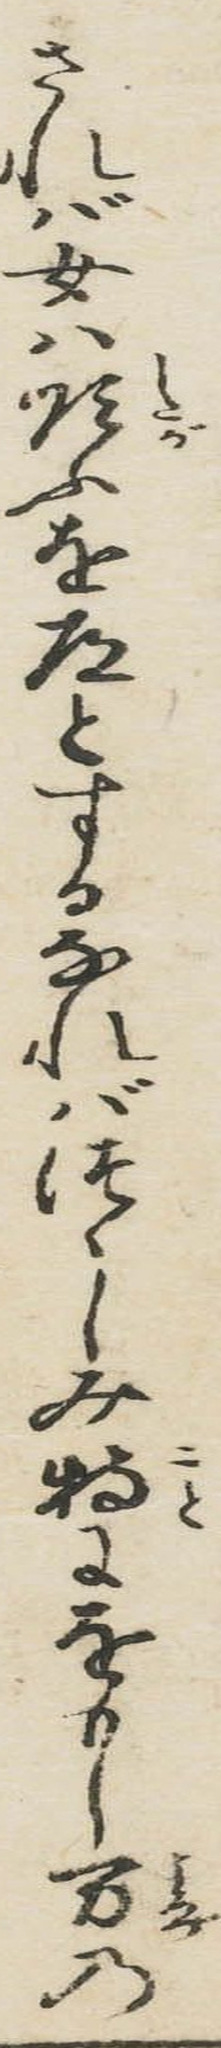されば女は順ふを道とするなればつゝしみ特にをもし万の
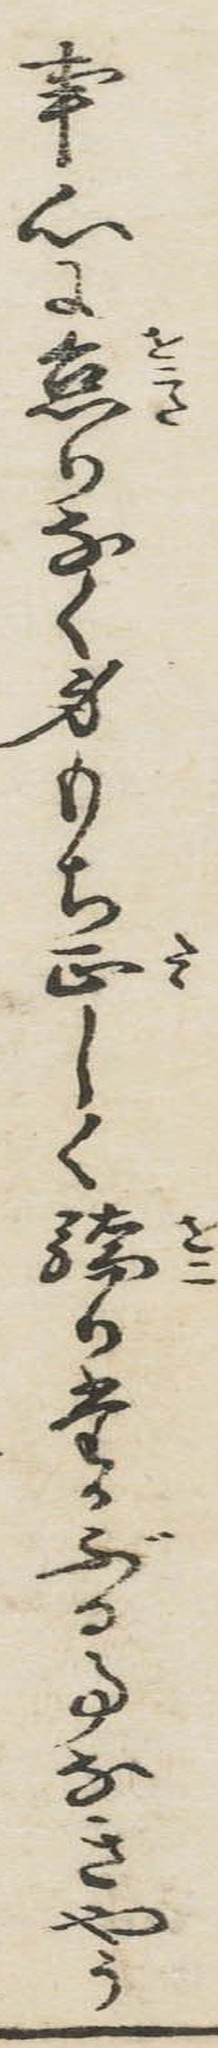事心に怠りなく身もち正しく驕りたかぶる事なきやう
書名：前訓
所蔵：東京学芸大学附属図書館
